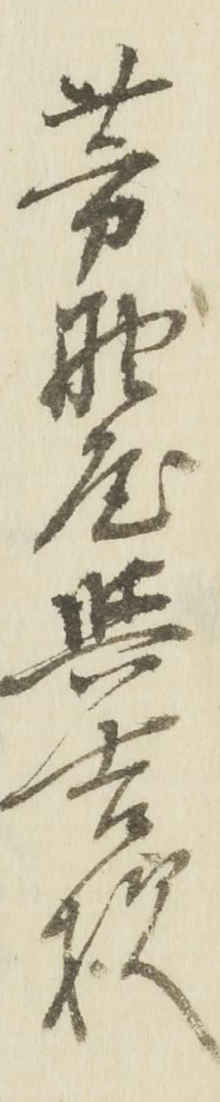芳野屋與吉様
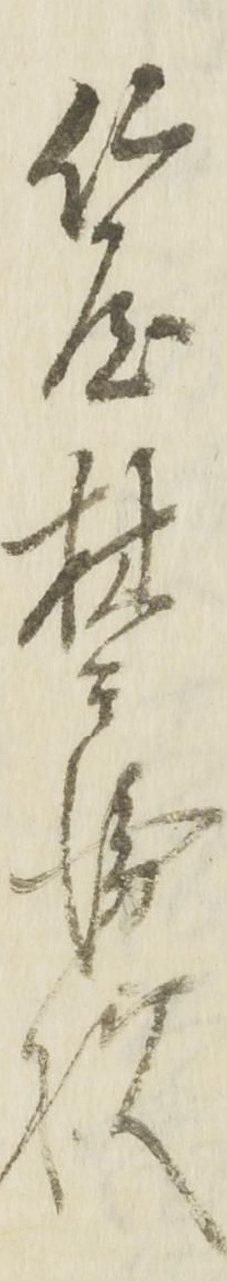竹屋林兵衛様
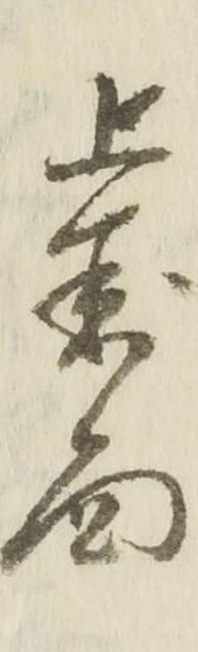上来面
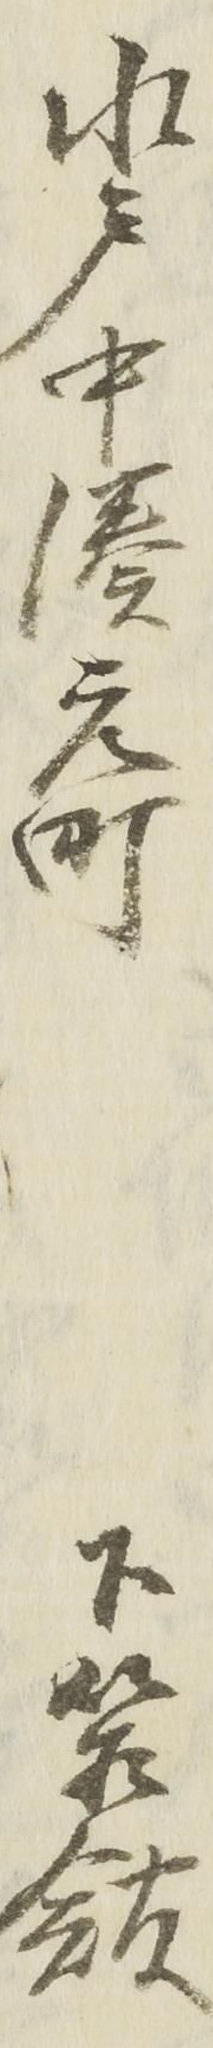水戸中湊元町下箱館
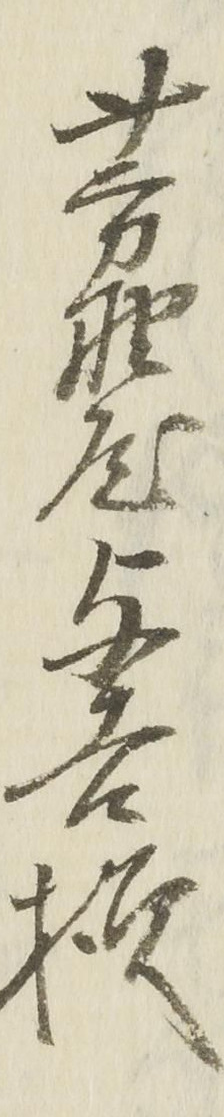芳野屋與吉様
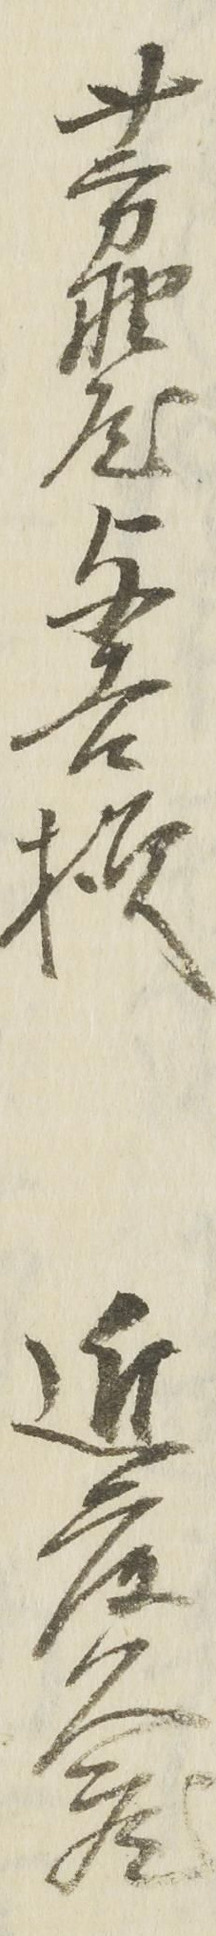芳野屋与吉様近藤久蔵
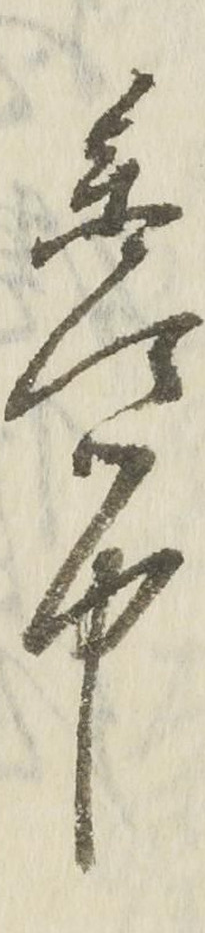参次御中
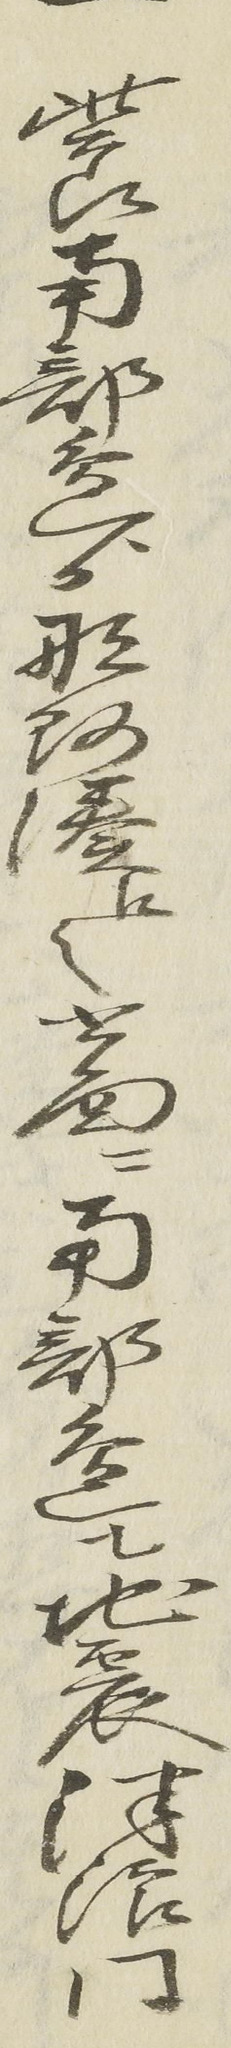一此節南部辺ゟ那阿湊江之書面ニ南部辺も地震津波同
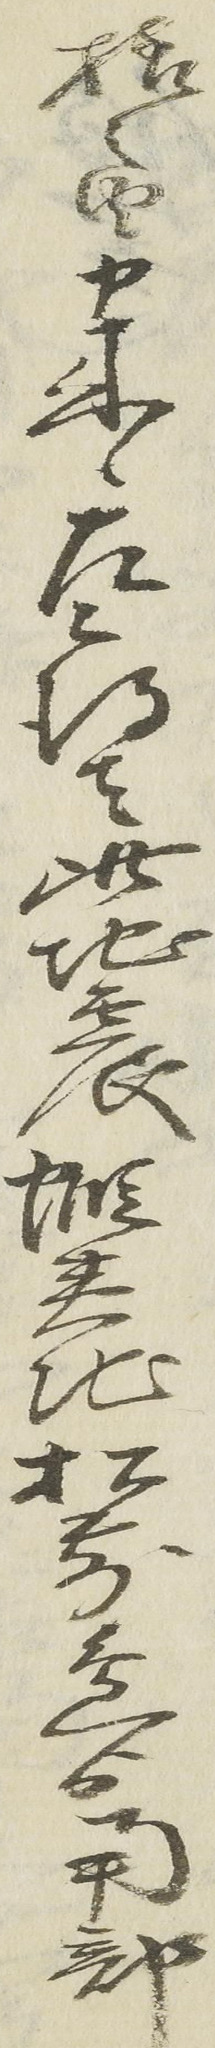様之由申来候左候得は此地震蝦夷地松前辺ゟ南部
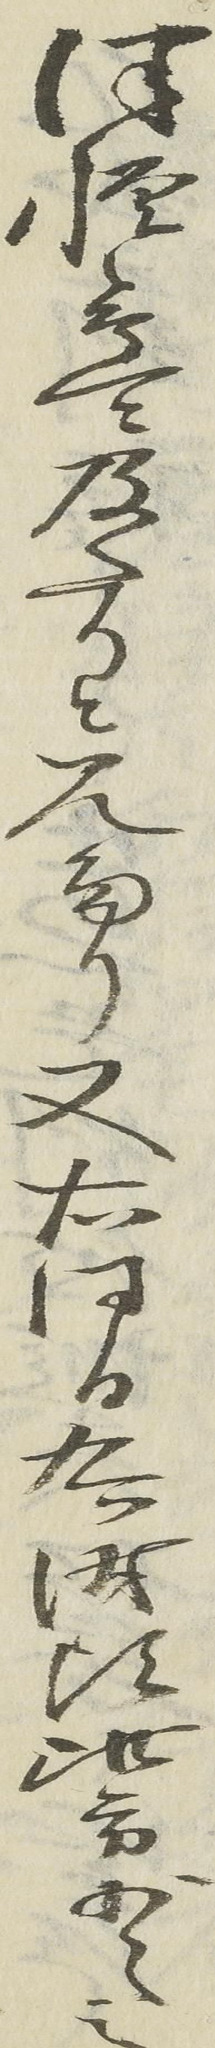津軽之辺ニ及たりと見たり又右同日九ツ時頃此方少し之
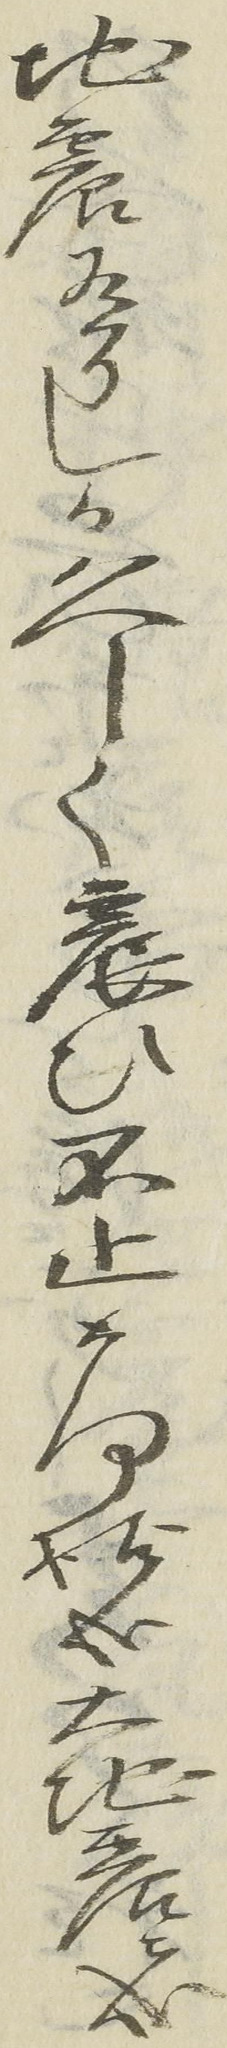地震有しか久しく震ひ不止如何様成大地震ニ成

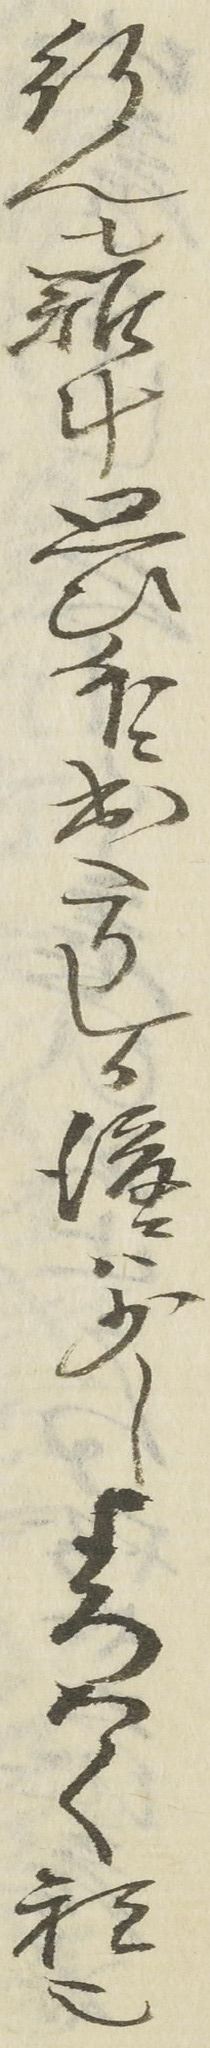行んも難計思ひ外ニ出たりしか後ニは少しよろめく程也
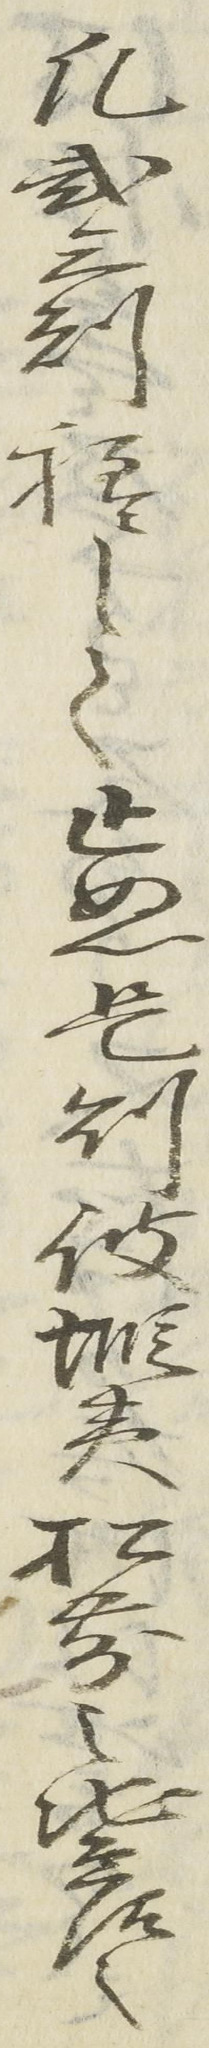凡弐三刻程ニして止ぬ是則彼蝦夷松前之地震之
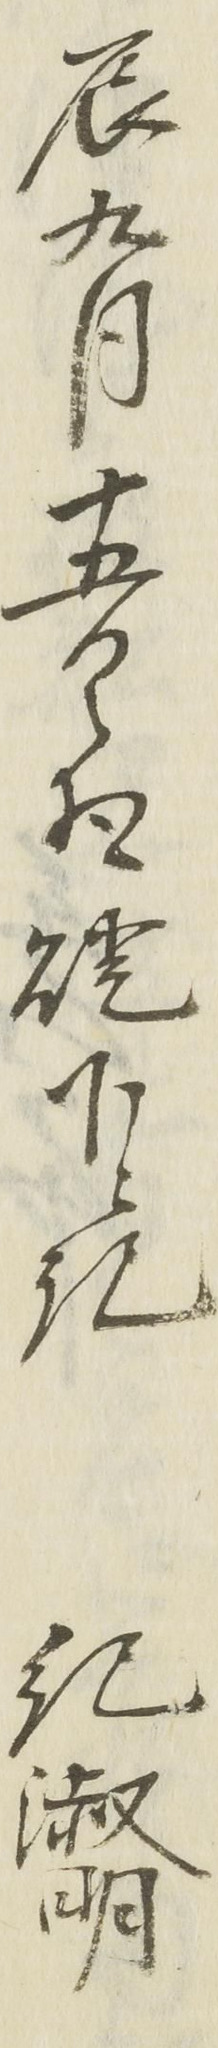辰九月十五日之夜燈下ニ記記淑明
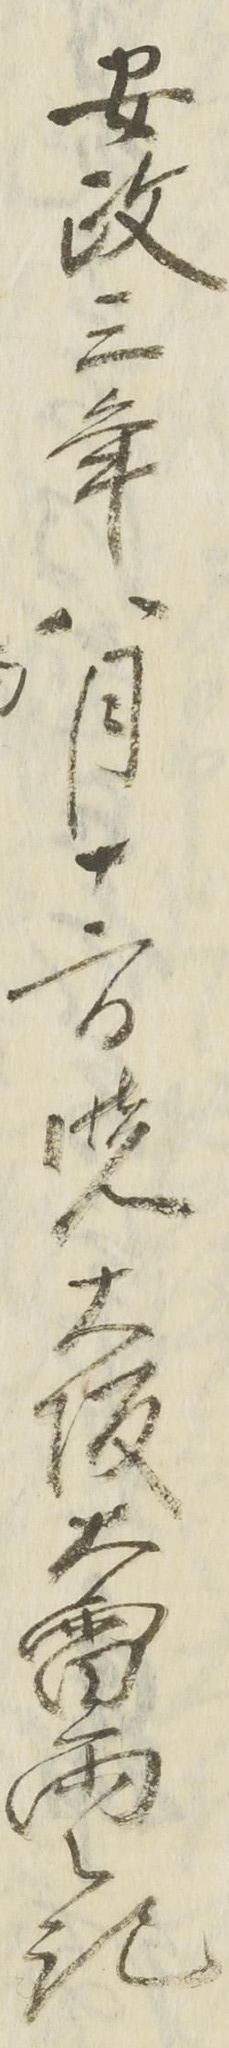安政三年八月十二日暁大坂大雷雨之記
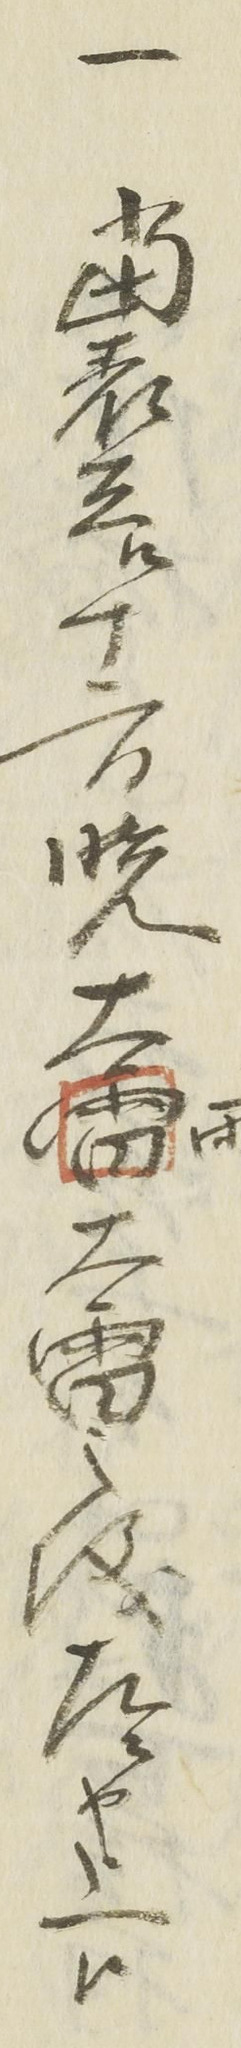一当表立候十二日暁大雨大雷之儀左ニ申上候
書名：安政乙卯江戸大地震筆記　安政丙辰八月大阪大雷雨之記追加　安政三辰年七月松前辺大地震并八月大風雨記録
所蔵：東京大学地震研究所図書室 Earthquake Research Institute Library, The University of Tokyo, JAPAN
